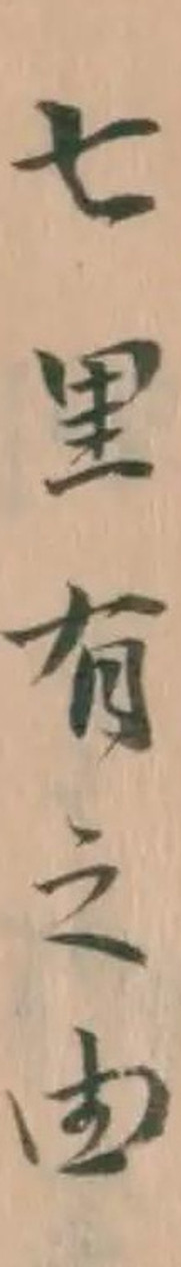七里有之由
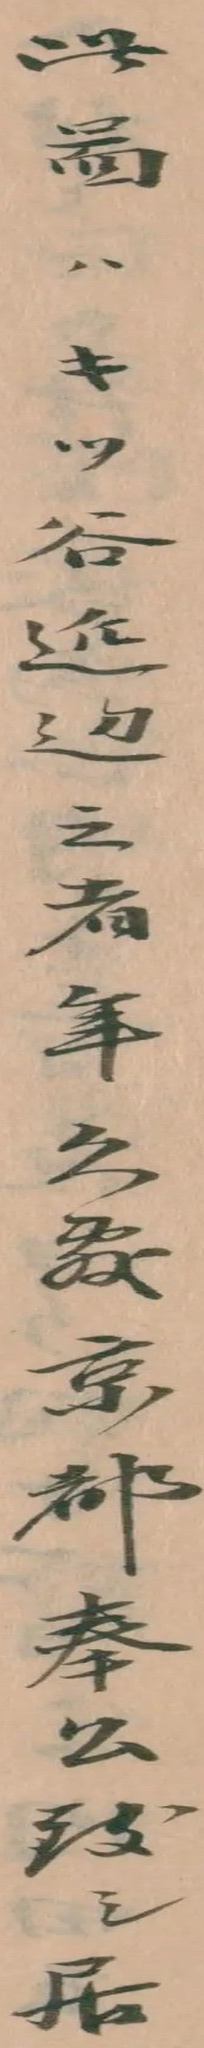此図ハキツ谷近辺之者年久敷京都奉候致シ居
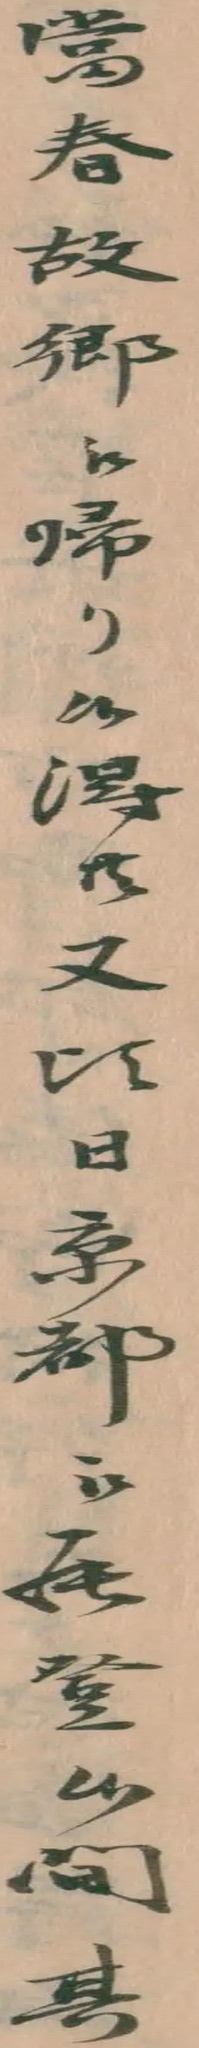当春故郷江帰り候得共又頃日京都江罷登候間其
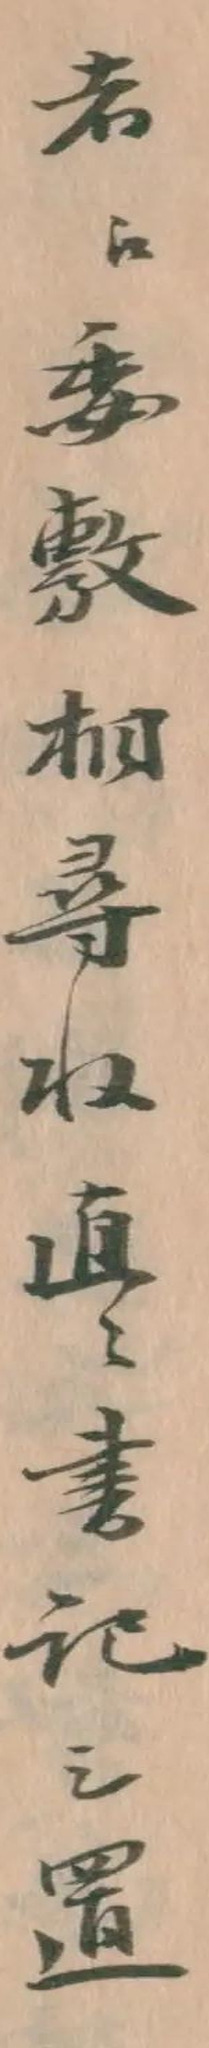者江委敷相尋ね直々書記シ置
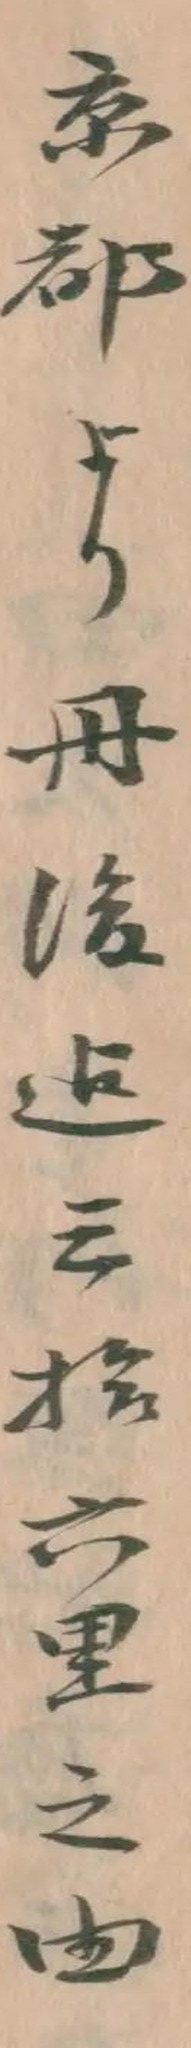京都より丹後迄三拾六里之由

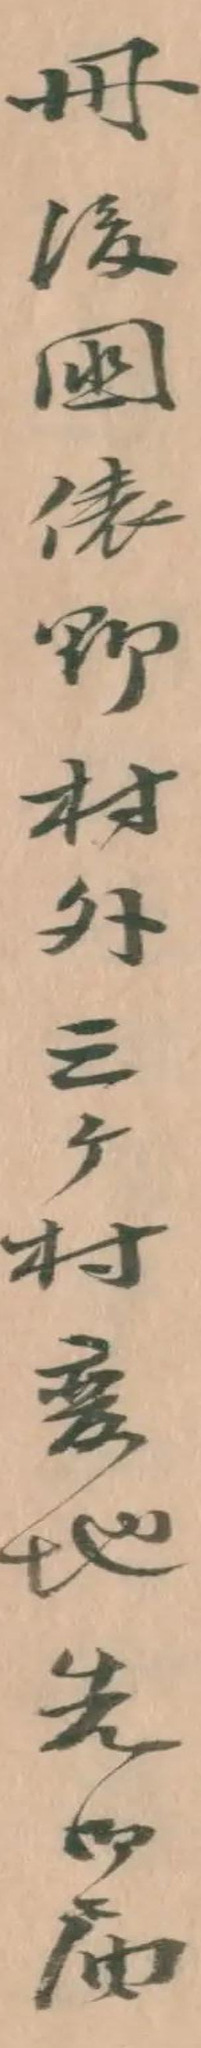丹後国俵野村外三ヶ村変地先御届
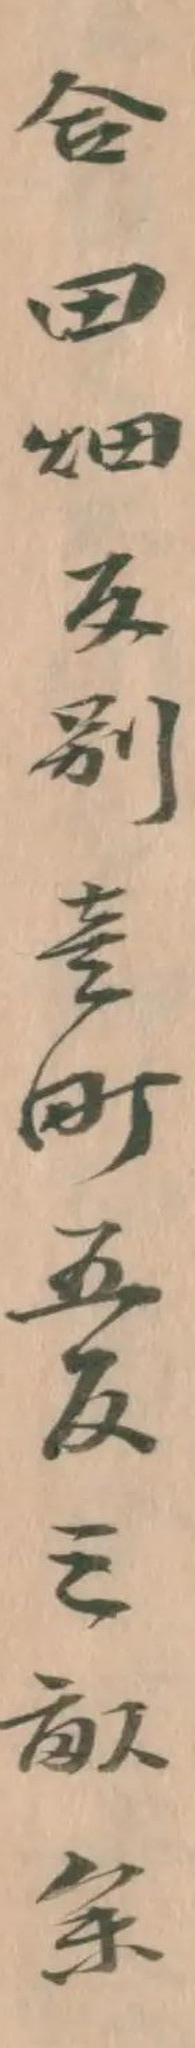合田畑反別壱町五反三畝余
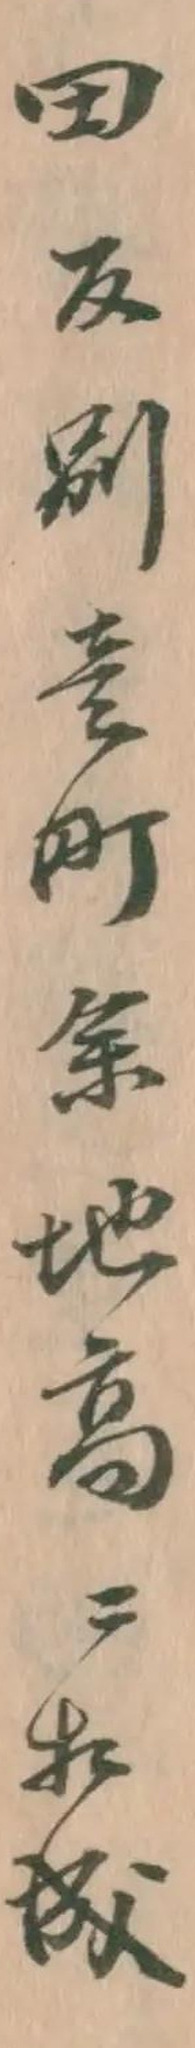内田反別壱町余地高二相成
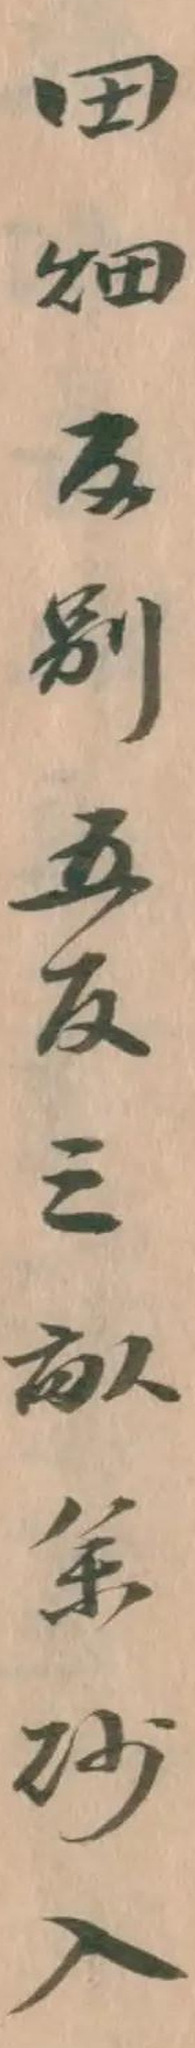田畑反別五反三畝余砂入
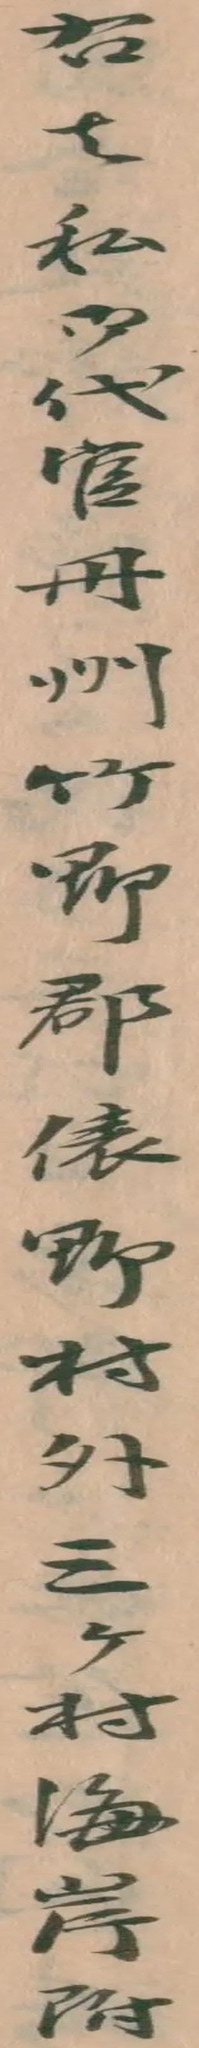右者私御代官所丹州竹野郡俵野村外三ヶ村海岸附
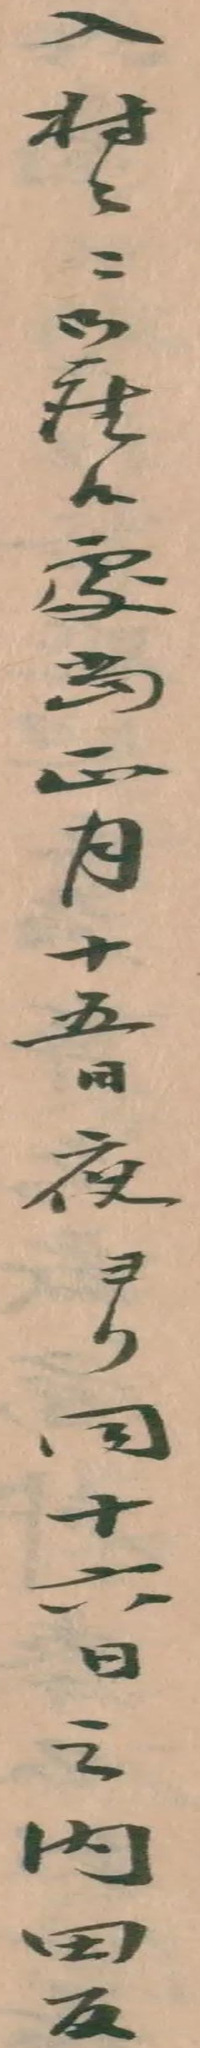入村々二御座候処当正月十五日夜ヨリ同十六日之内田反
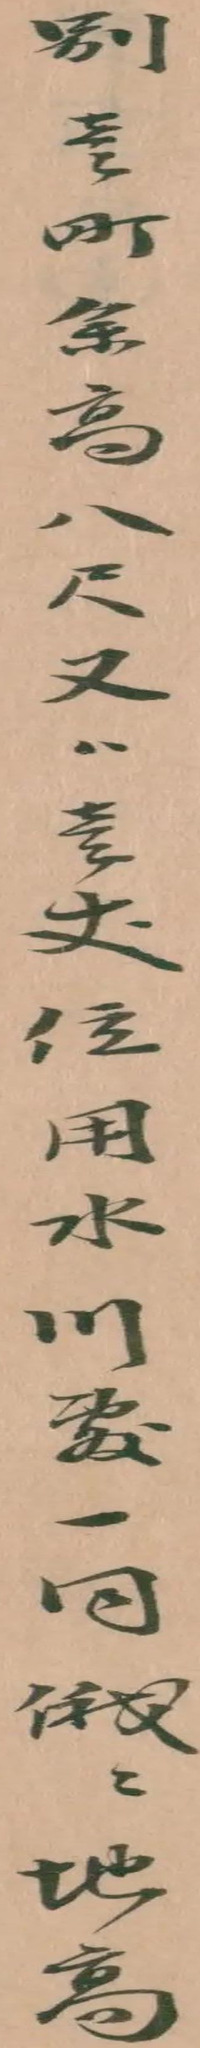別壱町余高八尺又ハ壱丈位用水川敷一同俄二地高
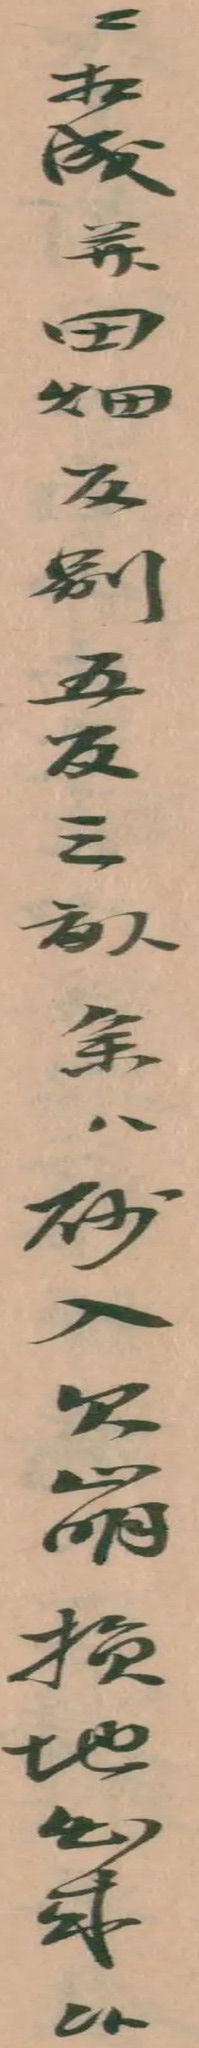二相成并田畑反別五反三畝余ハ砂入欠崩損地出来候
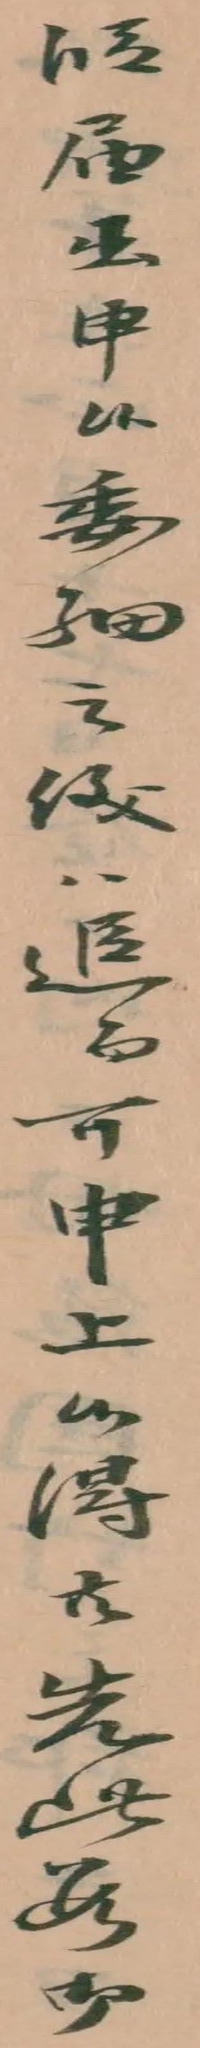段届出申候委細之儀ハ追而可申上候得共先此段御
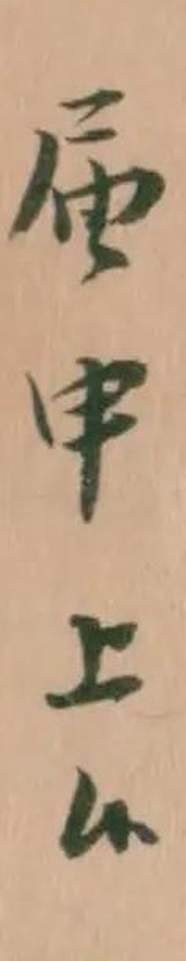届申上候
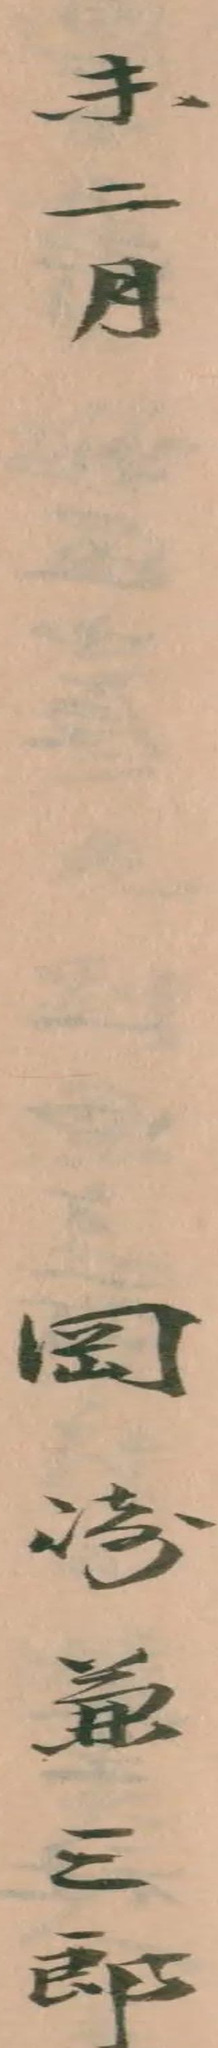未二月岡崎兼三郎
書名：地災撮要. 巻3(地震之部)-巻4(噴火之部)
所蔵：国立国会図書館 National Diet Library, JAPAN
